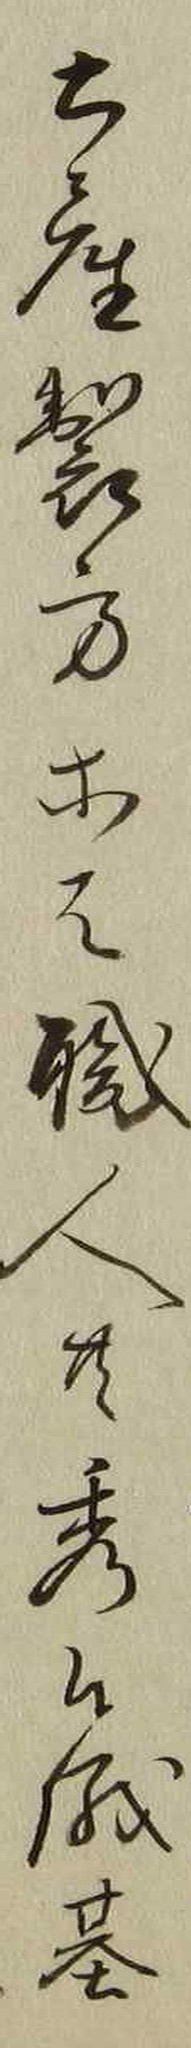土産製法等は職人共秀候儀基
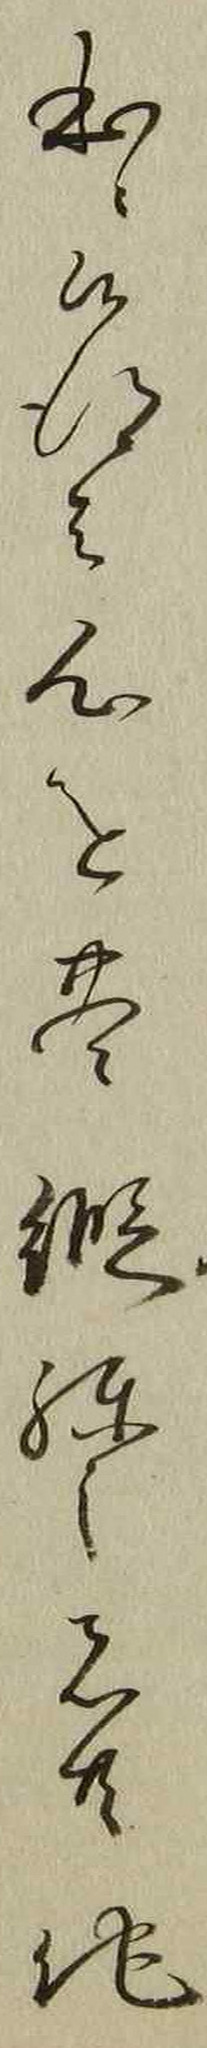本に候得者心を尽縦練之者共他
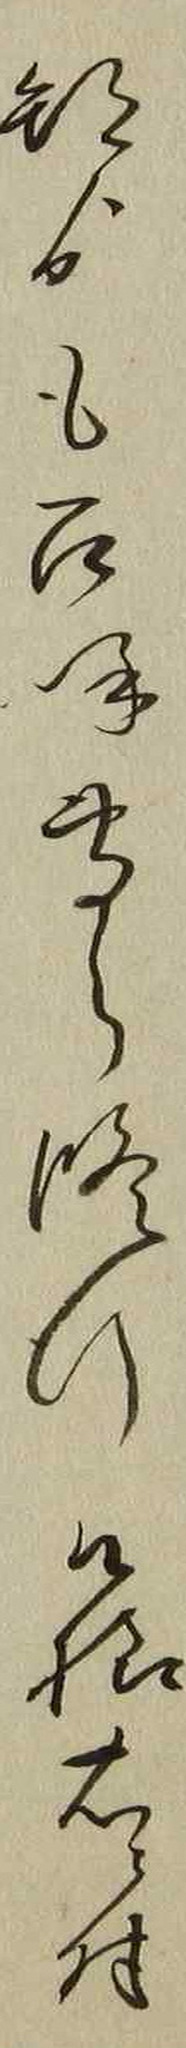領ゟも召呼専ら修行候様右に付
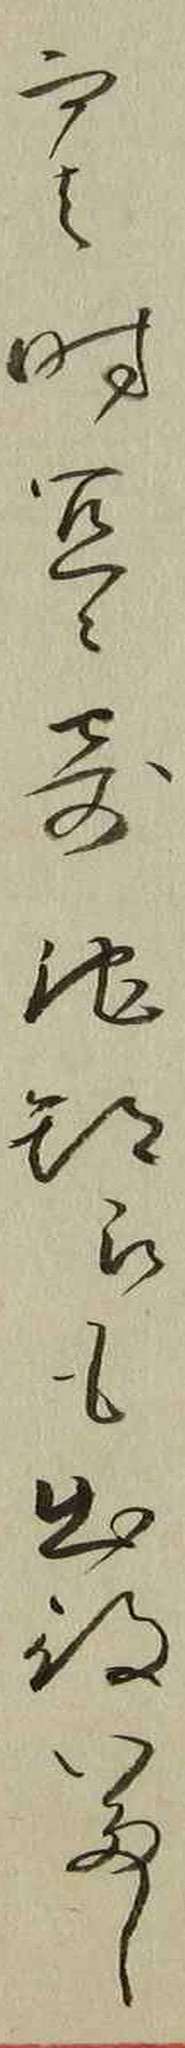而は時宜に寄他領江も出役いたし
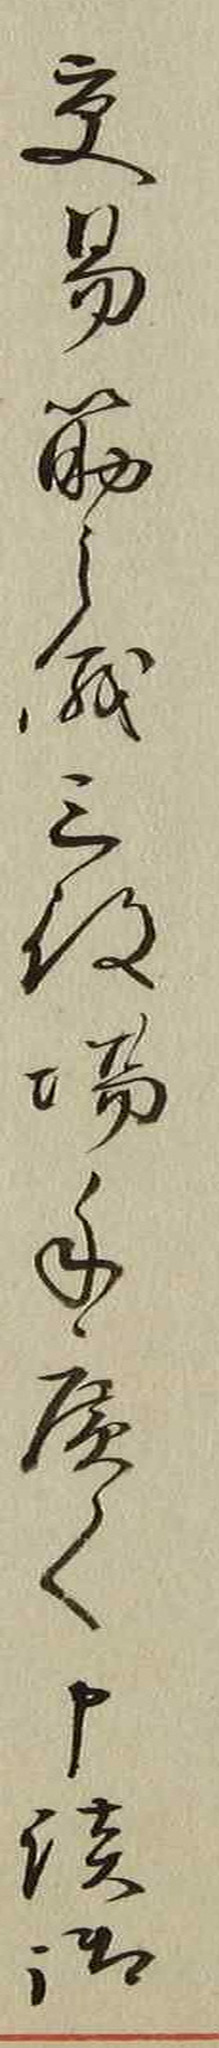交易筋の儀三役場手広く候申談御
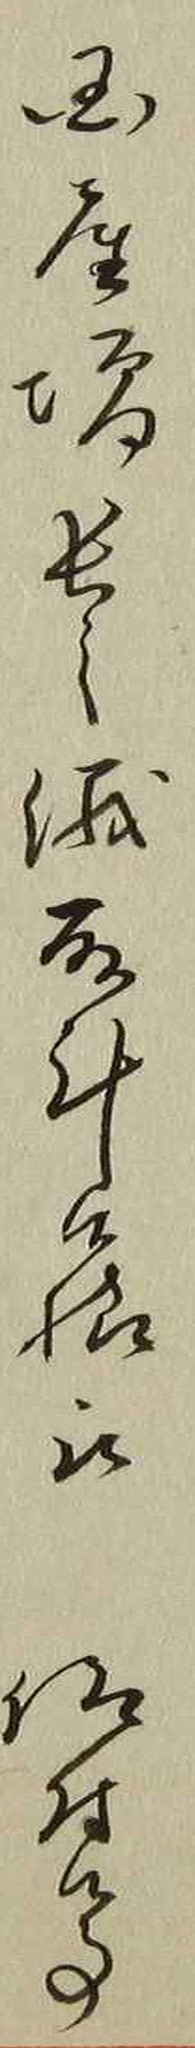国産増長之儀取計候様被仰付候事
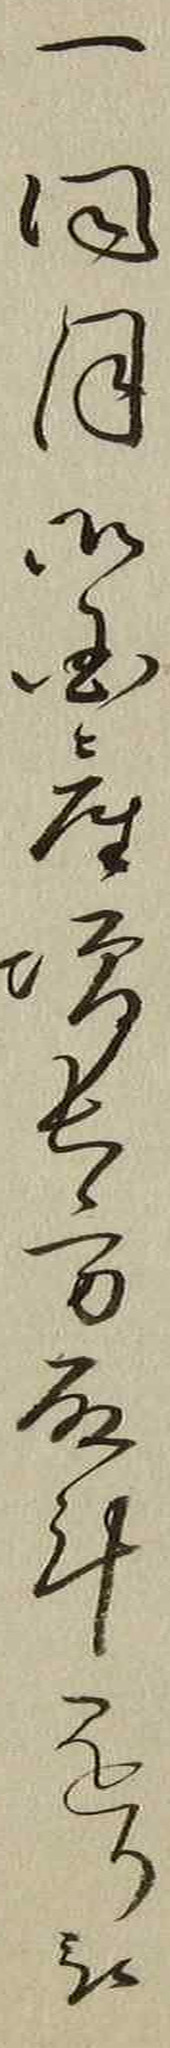一同月御国産増長方取計懸り被
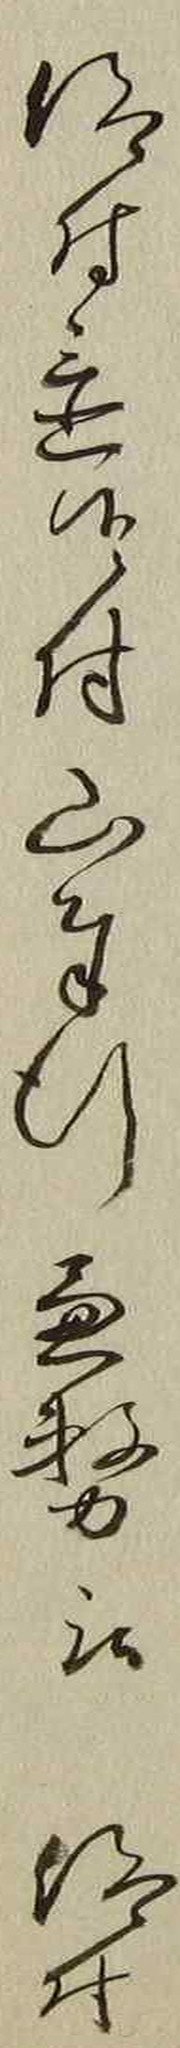仰付置候に付山奉行兼務被仰付
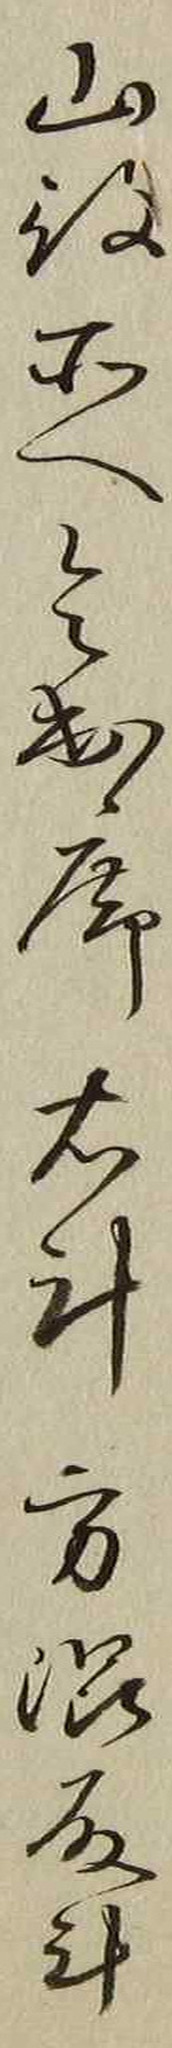山役所へ令出席右計方混取計
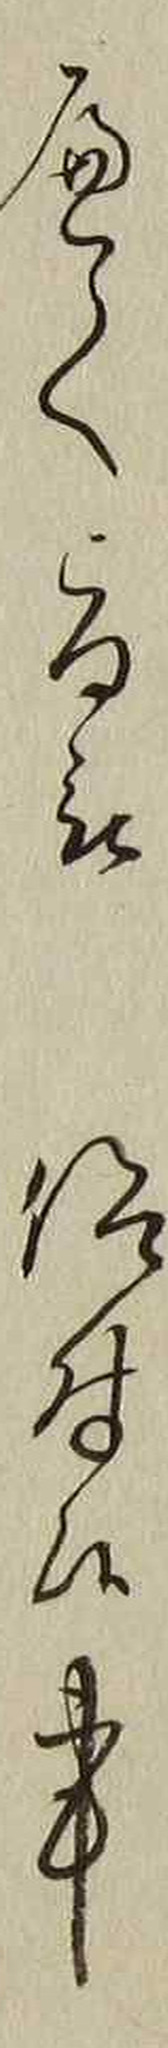へく旨被仰付候事
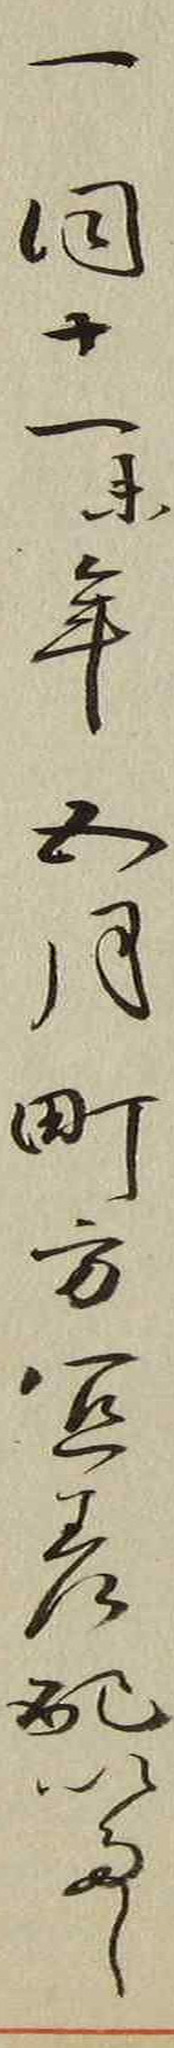一同十一未年五月町方宜差配いたし
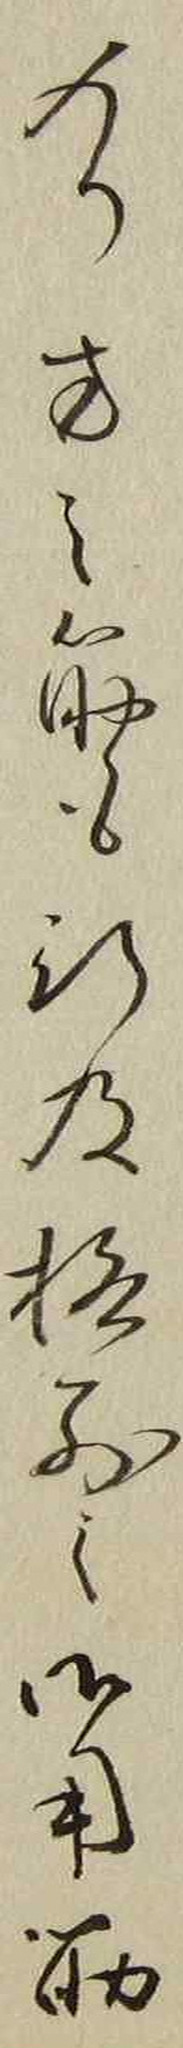〆り方の筋も行及格別之御用筋
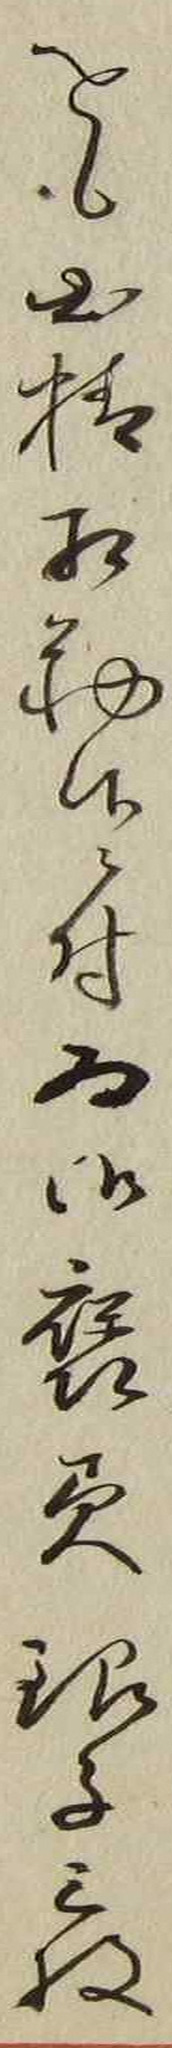をも出精相勤候に付為御褒美銀子三枚
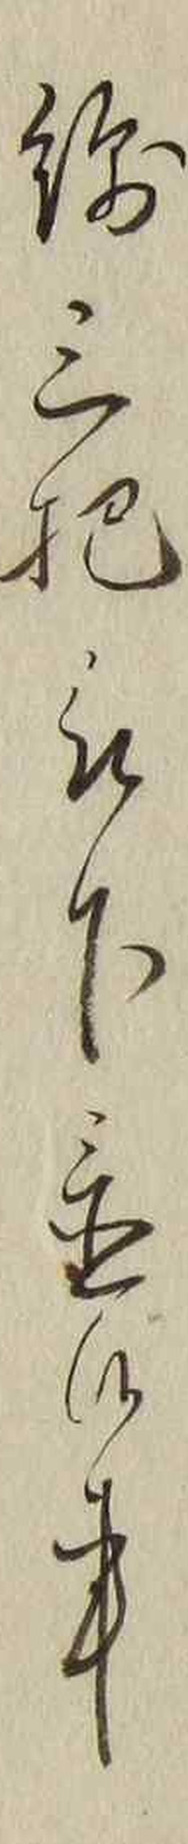綿三把被下置候事

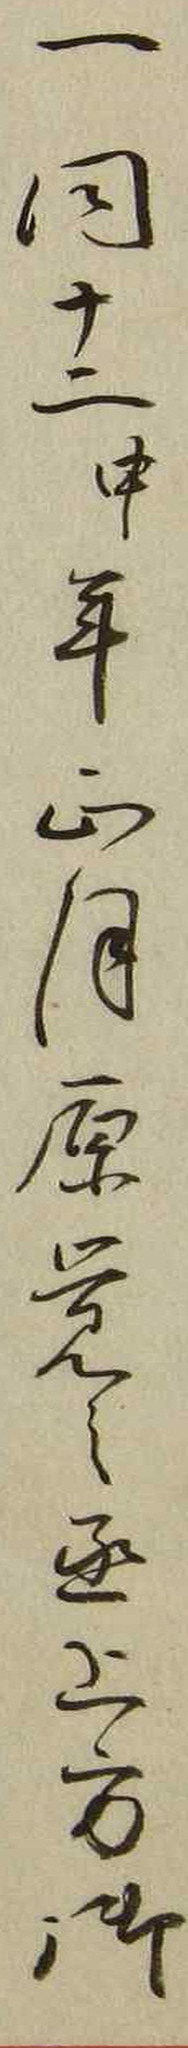一同十二申年正月原覚之丞上方御
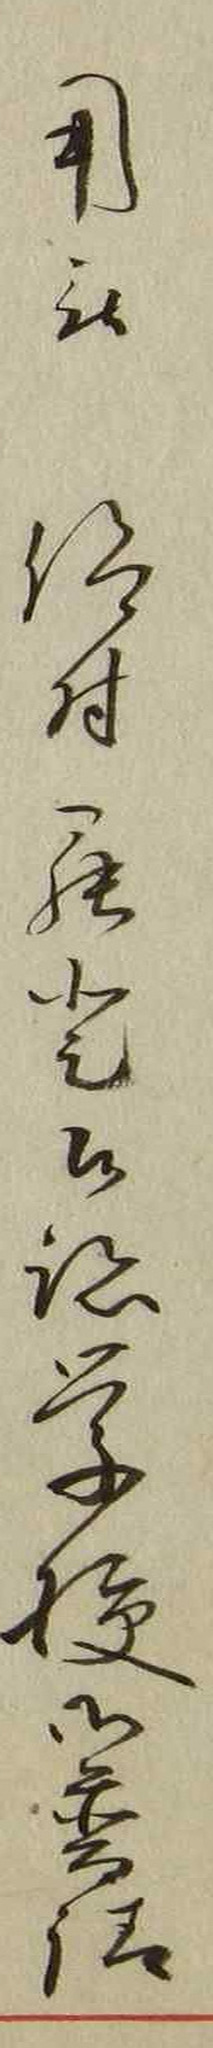用被仰付罷登候跡学校御普請
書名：諸士系譜　巻之3　い之部3
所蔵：会津若松市立会津図書館
